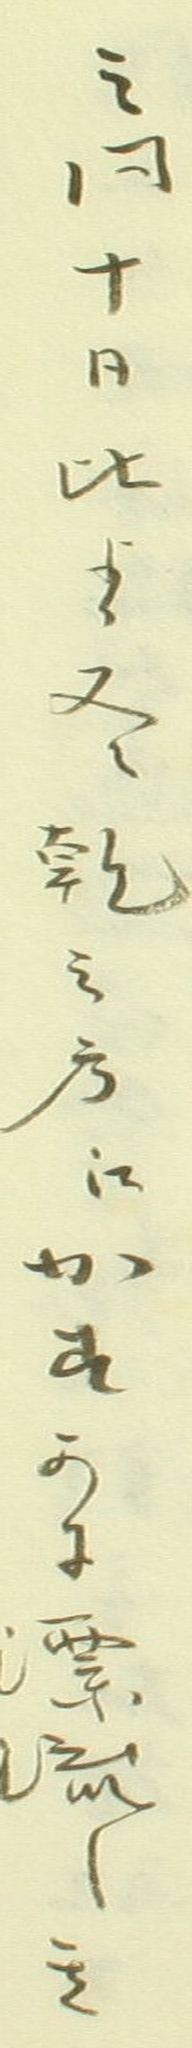之同十日頃より又の乾之方江かすかに漂流し其
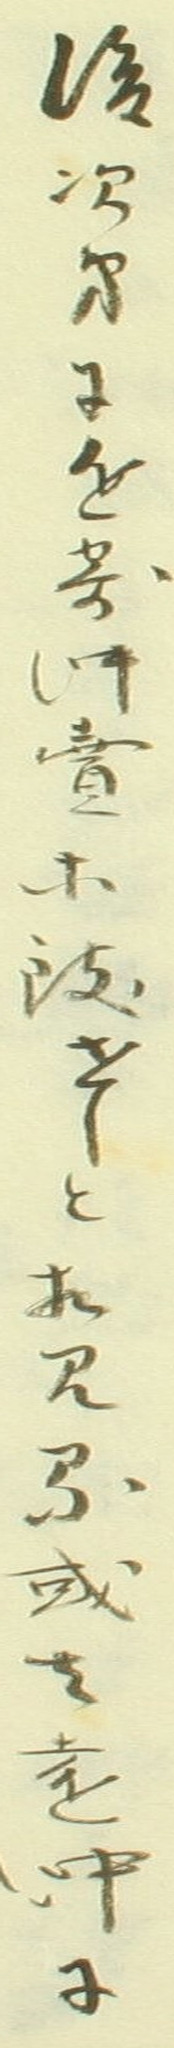後次第に近寄沖売等致せしと相見る或は遠沖に
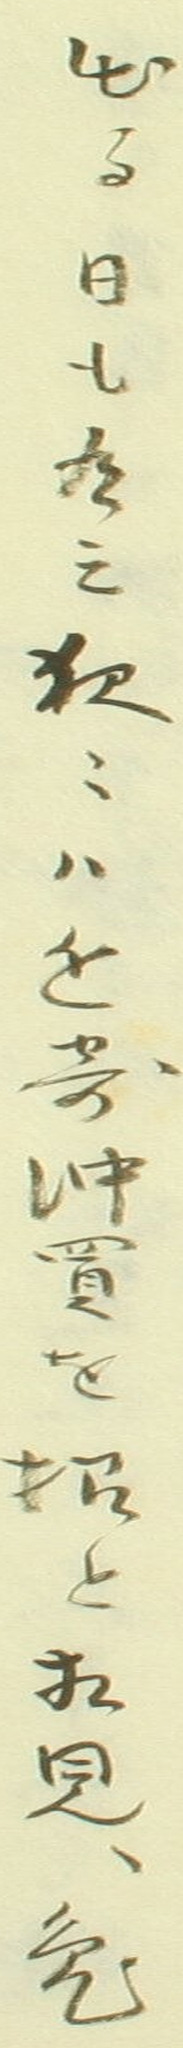出る日も有之夜には近寄沖買を招と相見へ兎
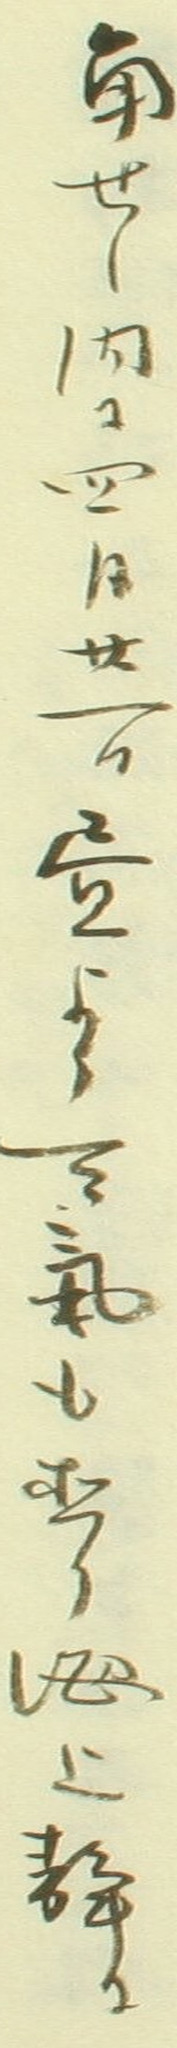角せし間に四月廿一日昼より天気も直り海上静り
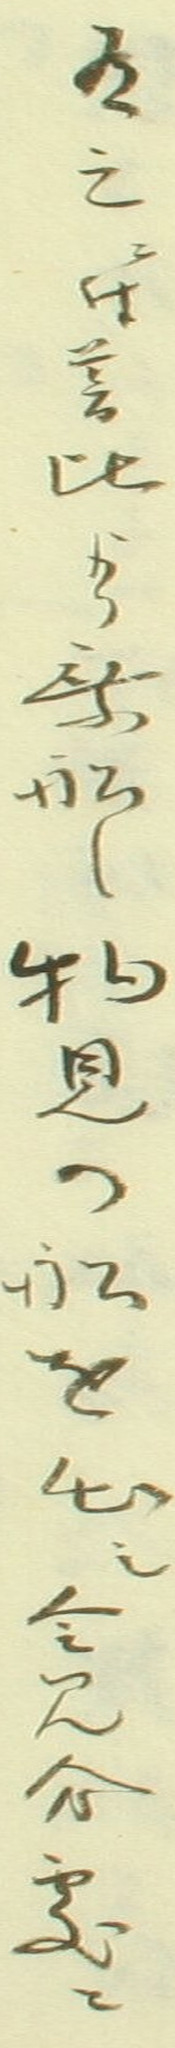有之に付暮頃より乗船し物見の船を出し全員分處に
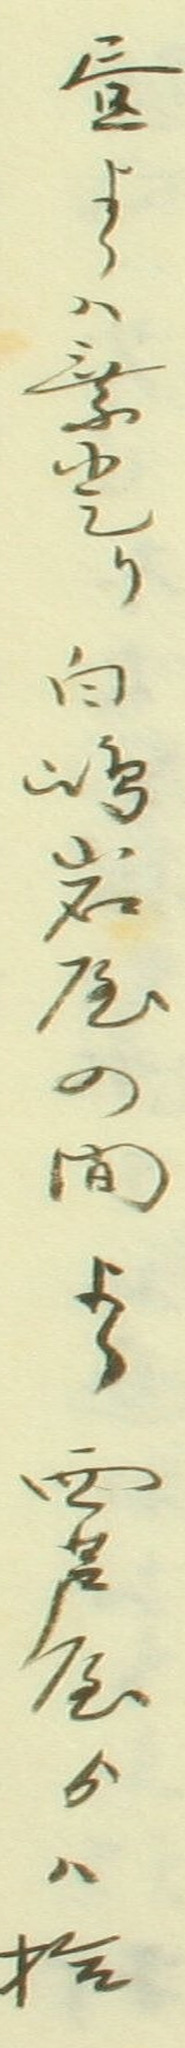昼よりは乗登り白嶋岩屋の間より西芦屋ゟは拾
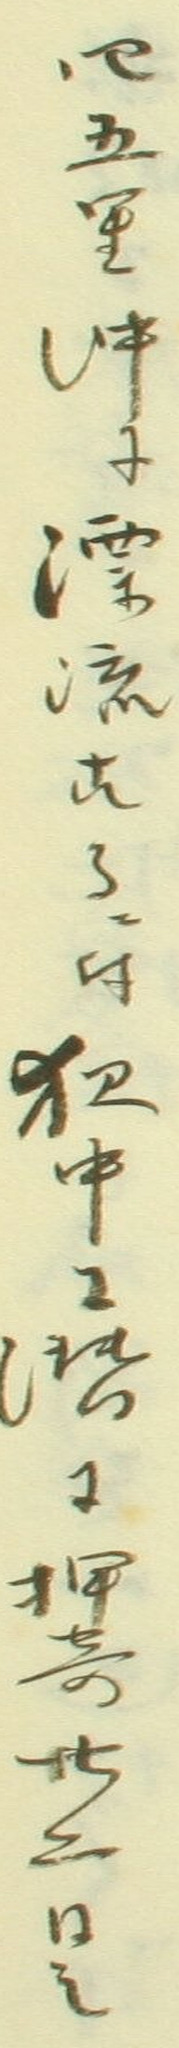四五里沖に漂流するに付夜中に潜に押寄廿二日之

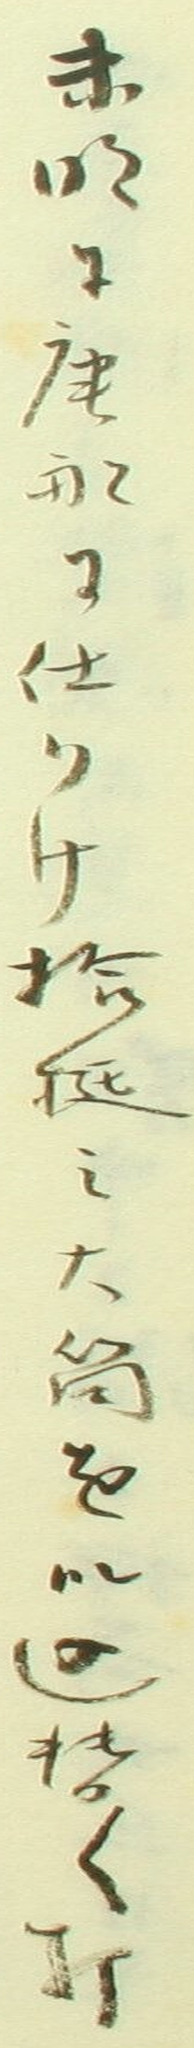未明に唐船に仕かけ拾挺之大筒を以込替込替打
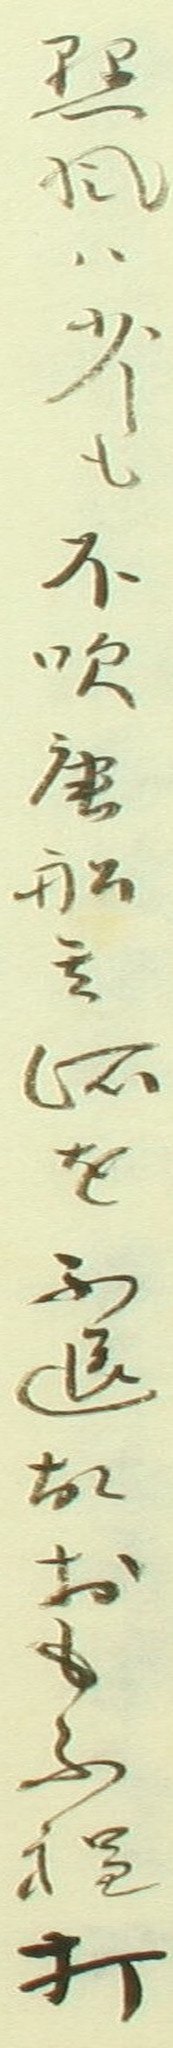懸風は少しも不吹唐船其所を不退故おもふ程打
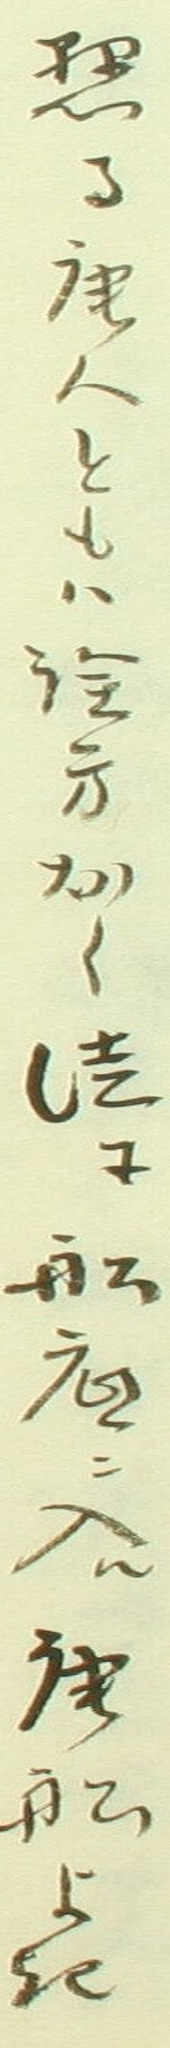懸る唐人ともは詮方なく徒に船底に入る唐船よき
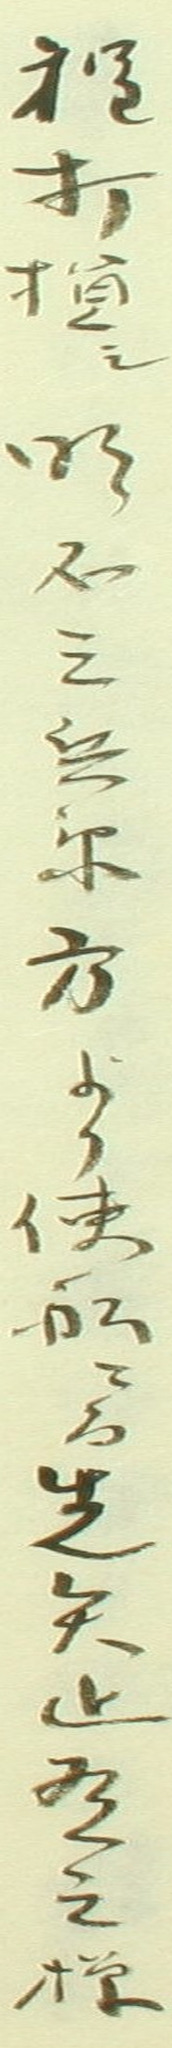程打損し明石三兵衛方より使船に而先矢止有之様
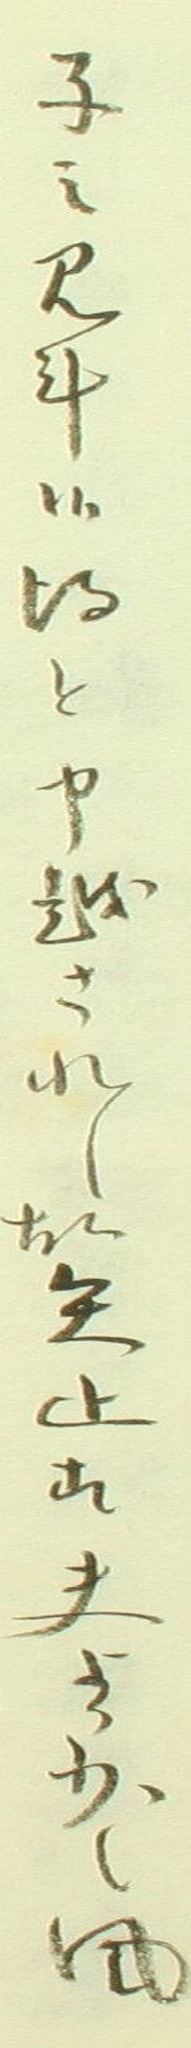子之見斗候得と申越されし故矢止す夫より少し風
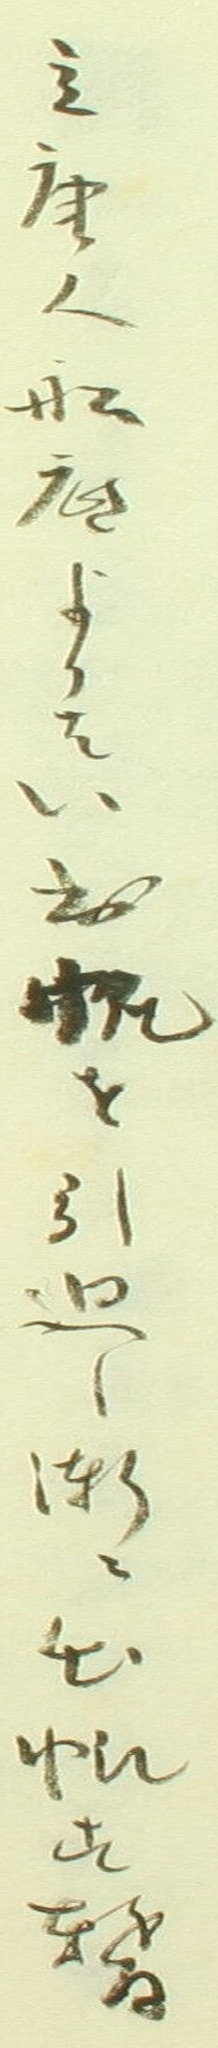立唐人船底よりはい出帆を引廻し漸に出帆す暫
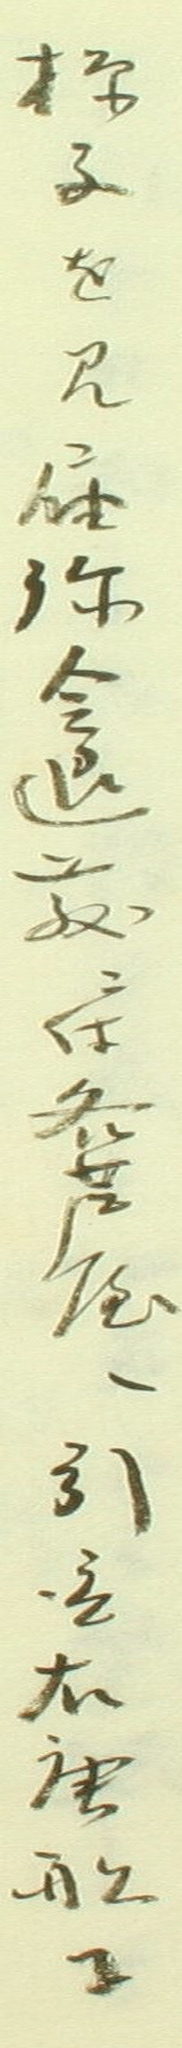様子を見届弥会退處に付芦屋へ引取右唐船に
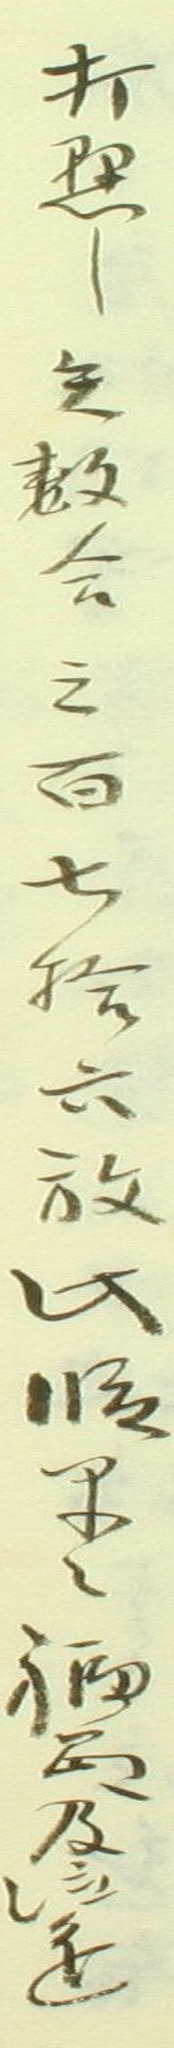打懸し矢数会三百七拾六放此段早々福岡及注進
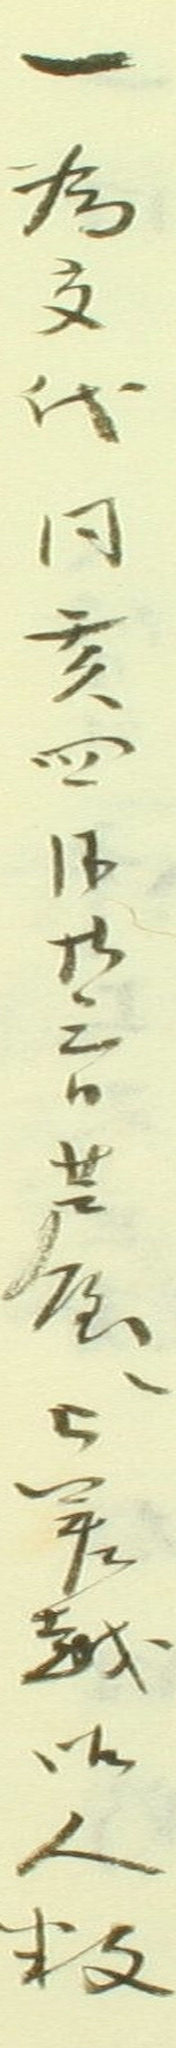一為交代同亥四月廿三日芦屋へ被差越御人数
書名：唐船漂流記 三
